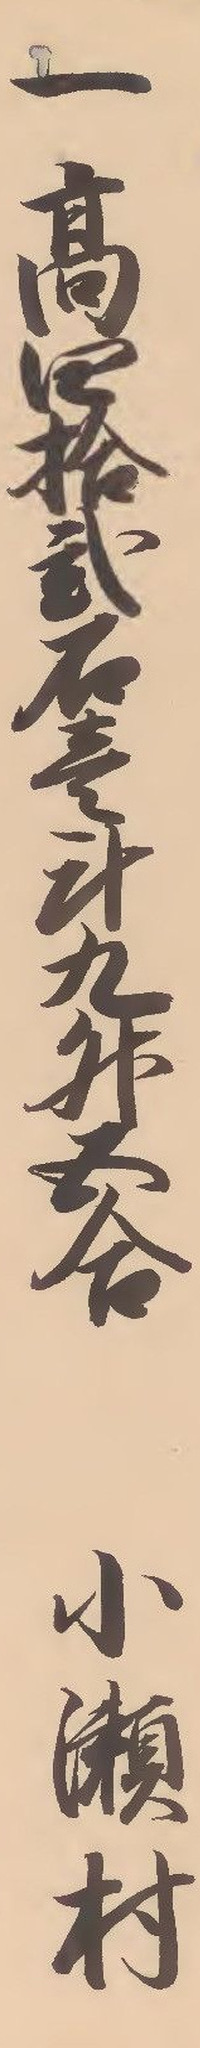一高四拾弐石壱斗九升五合小瀬村
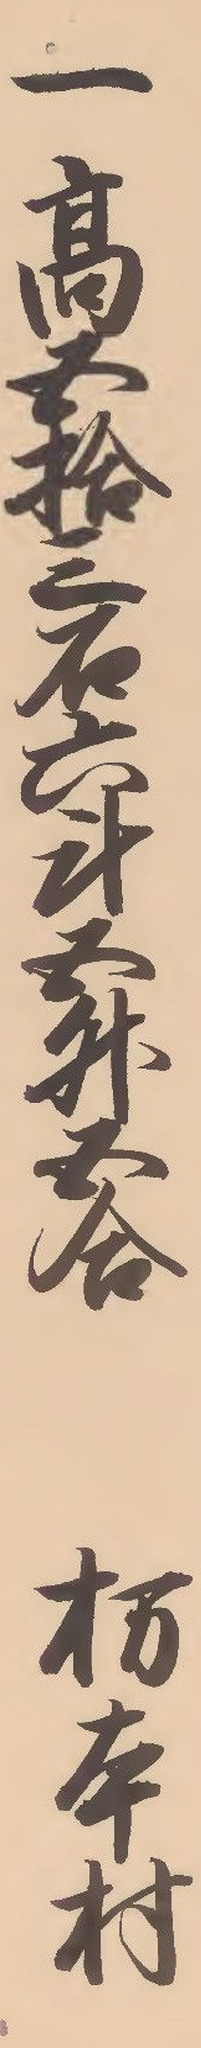一高五拾三石六斗五升五合栃本村

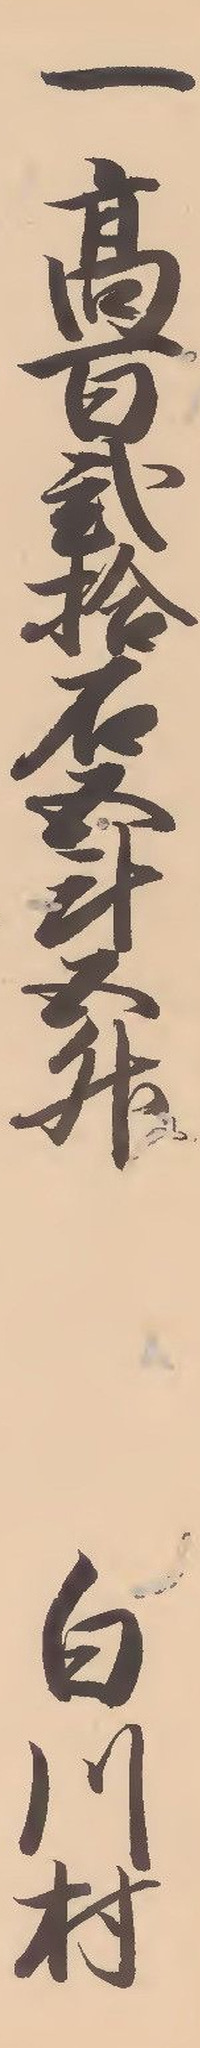一高百弐拾石五斗五升白川村
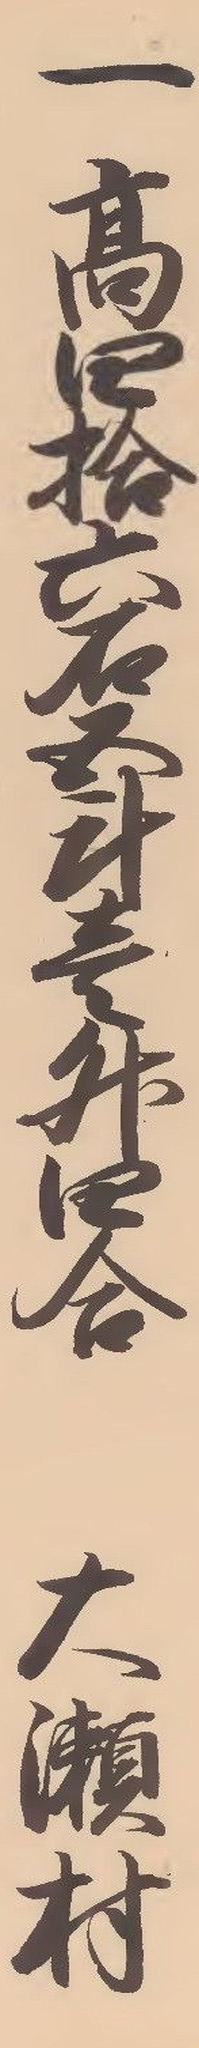一高四拾六石五斗壱升四合大瀬村
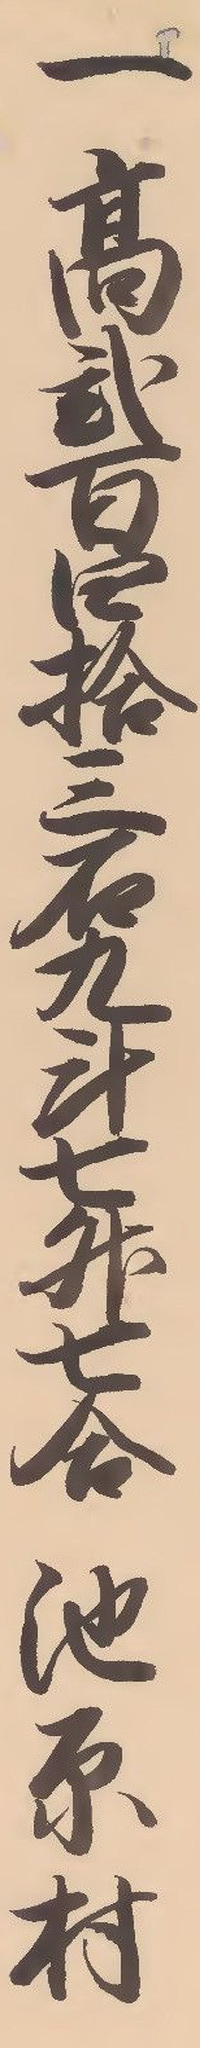一高弐百四拾三石九斗七升七合池原村
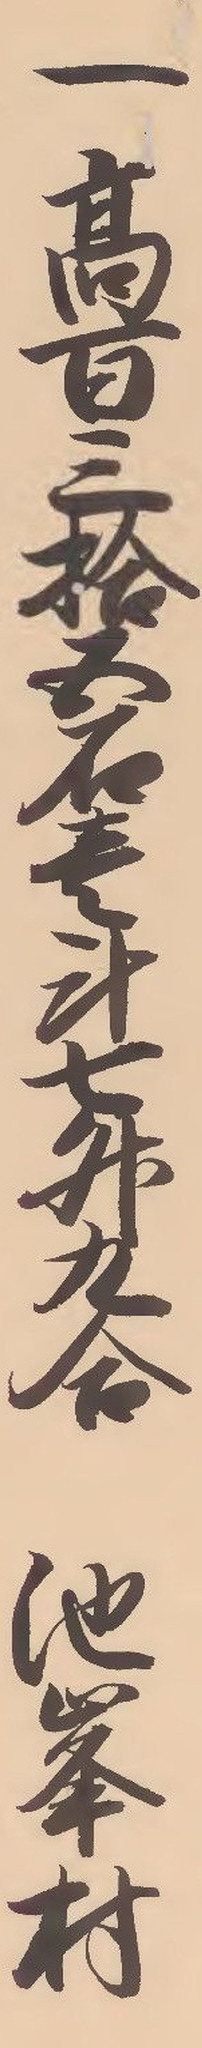一高百三拾五石壱斗七升九合池峯村
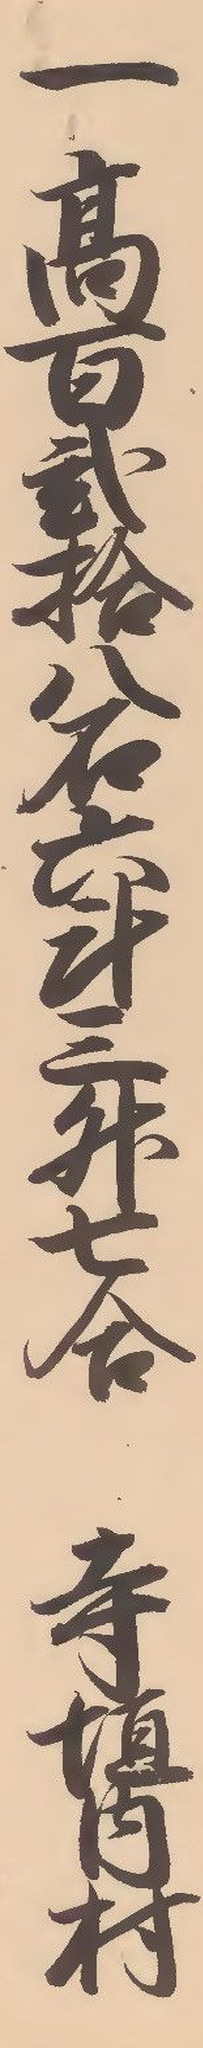一高百弐拾八石六斗三升七合寺垣内村
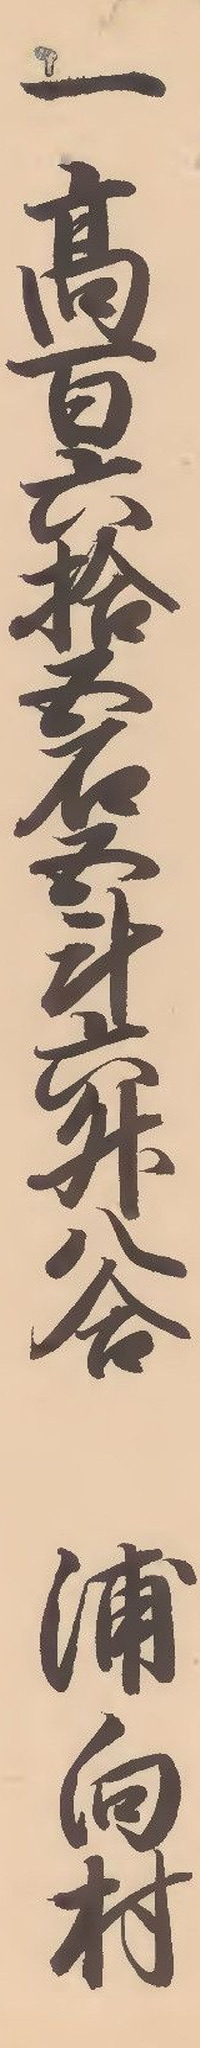一高百六拾五石五斗六升八合浦向村
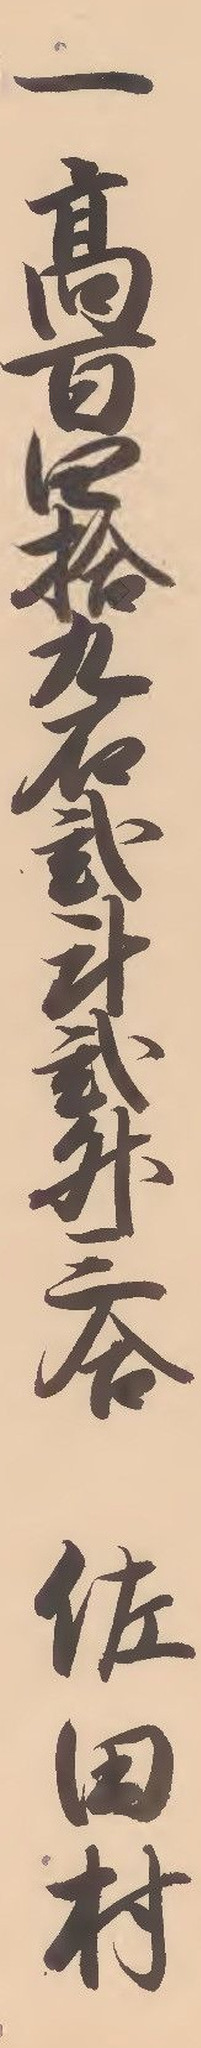一高百四拾九石弐斗弐升三合佐田村
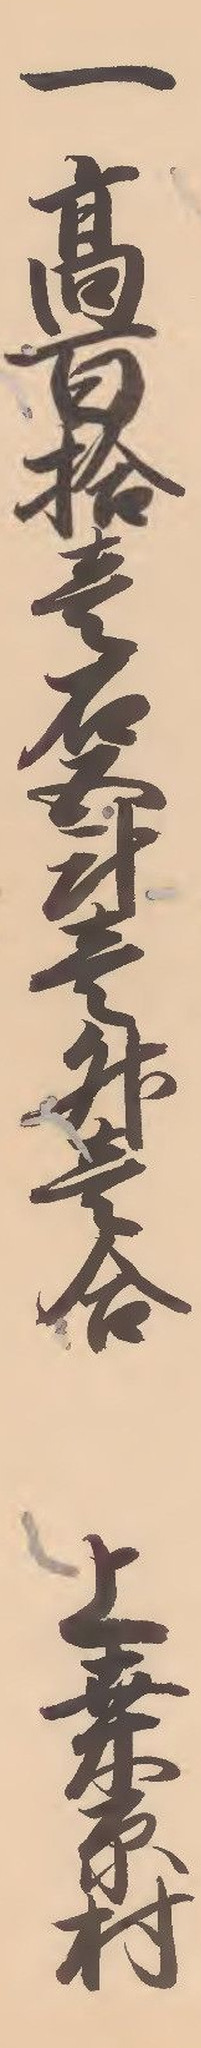一高百拾壱石五斗壱升壱合上桑原村

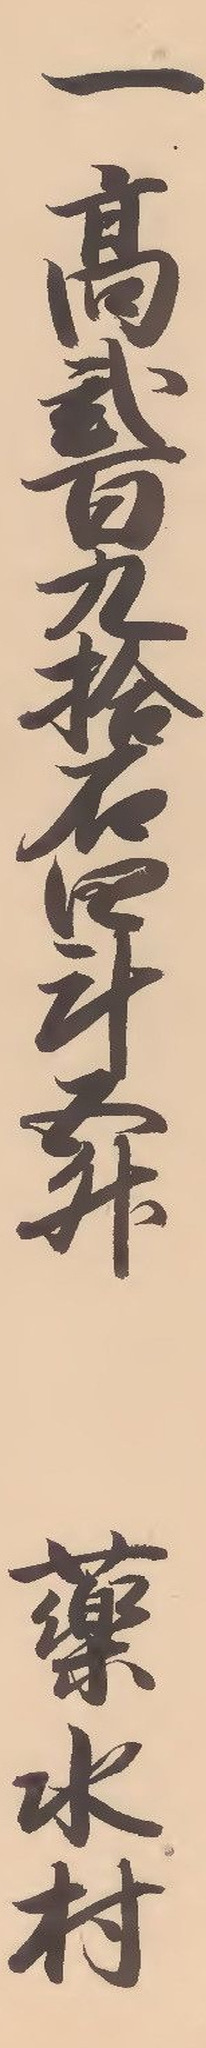一高弐百九拾石四斗五升薬水村
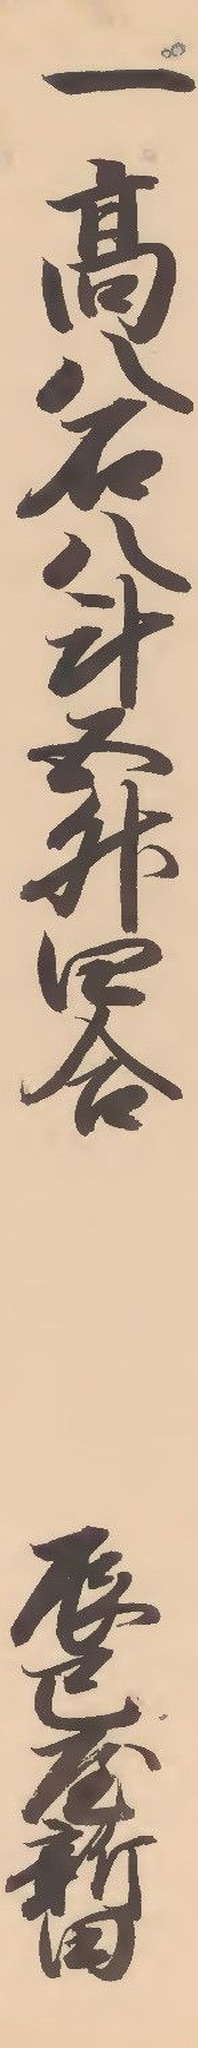一高八石八斗五升四合辰巳屋新田
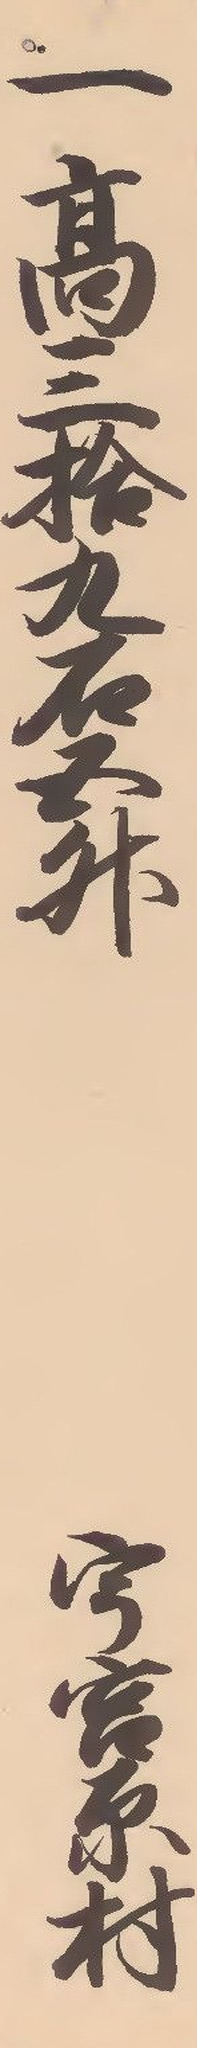一高三拾九石五升宇宮原村
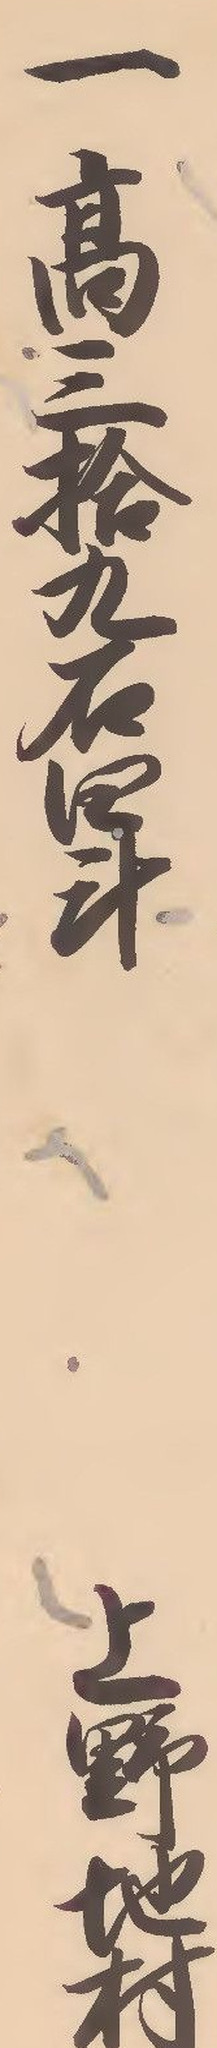一高三拾九石四斗上野地村

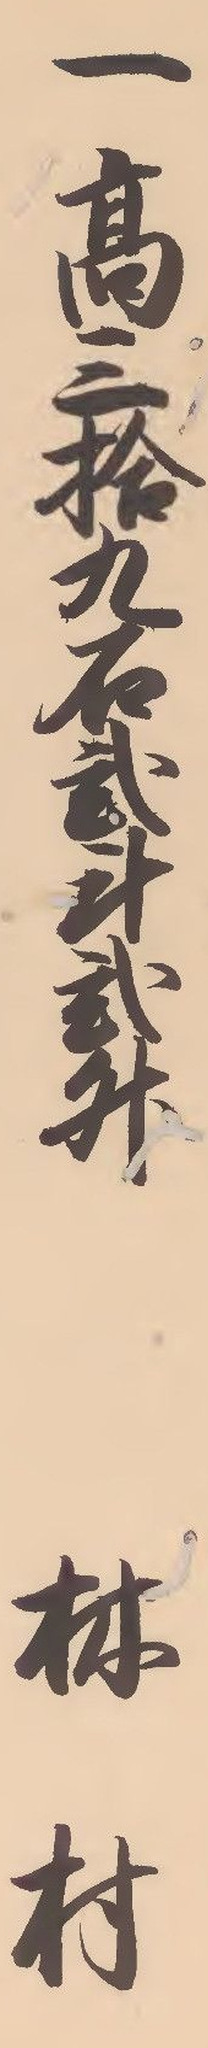一高三拾九石弐斗弐升林村
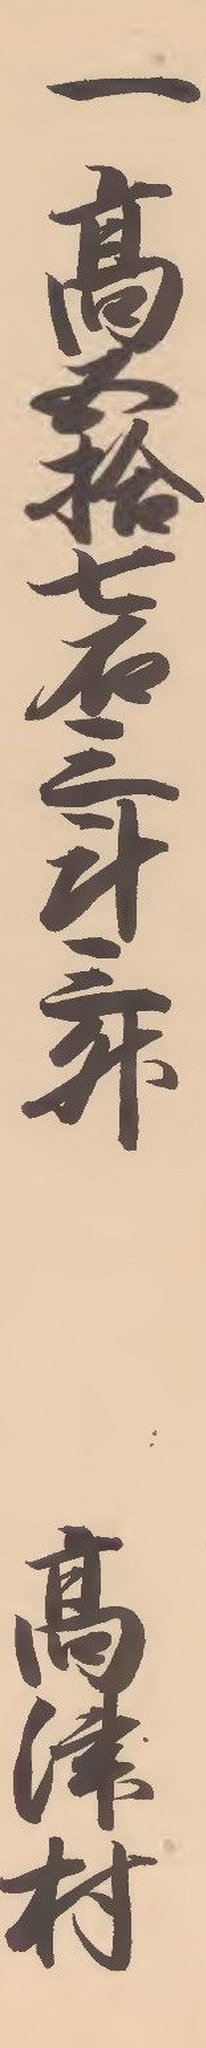一高五拾七石三斗三升高津村
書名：大和国郷帳
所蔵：国立公文書館 National Archives of Japan
